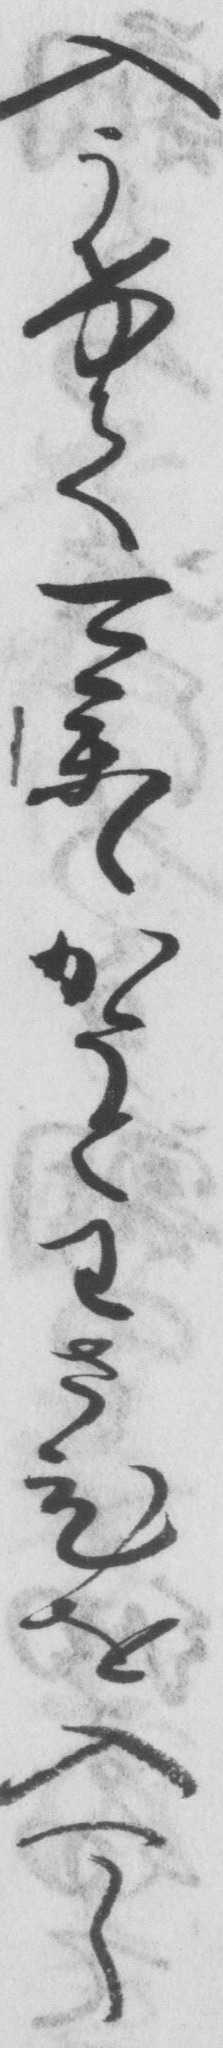入うけて可参候かうとわさひを入へし
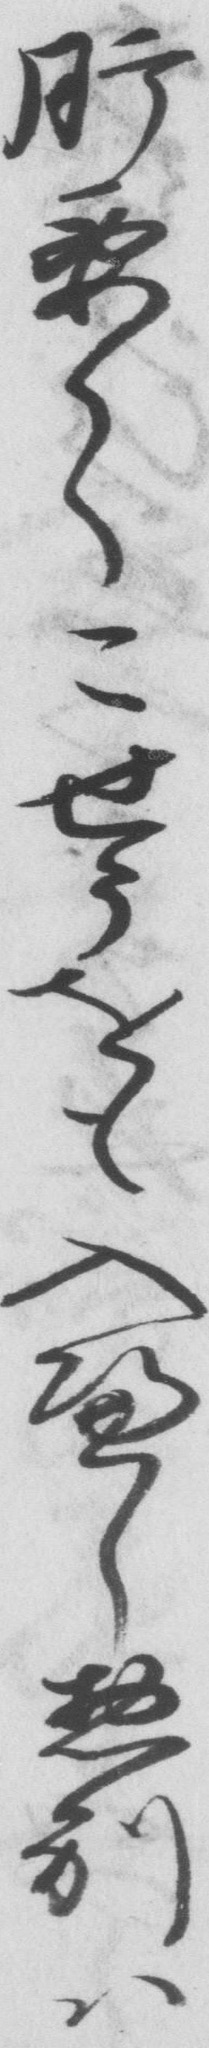肝要候こせうをも入へし惣別は
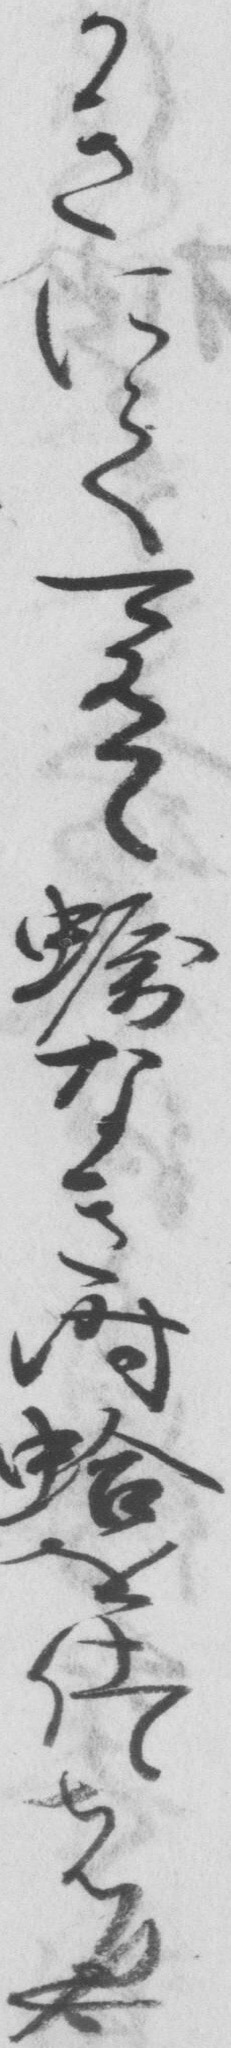かきにて可有候蠣なき時蛤を仕候者也
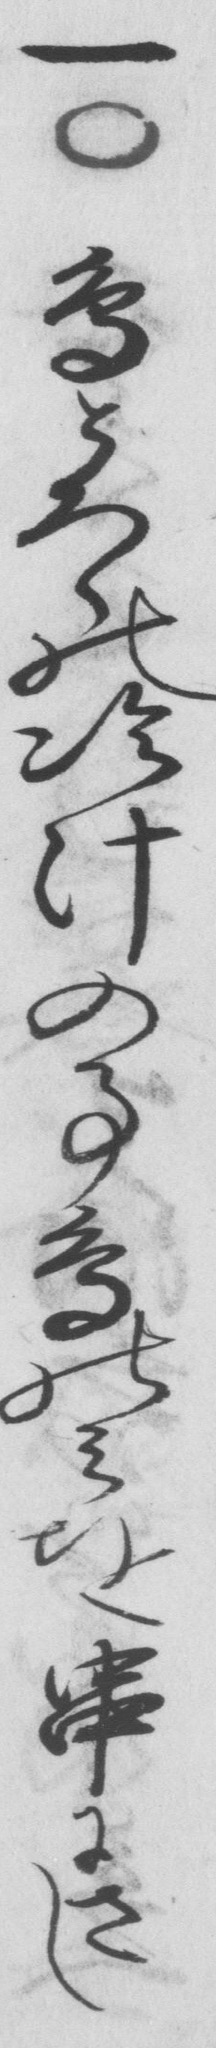一○鳥とろゝの冷汁の事鳥のみを串にさし
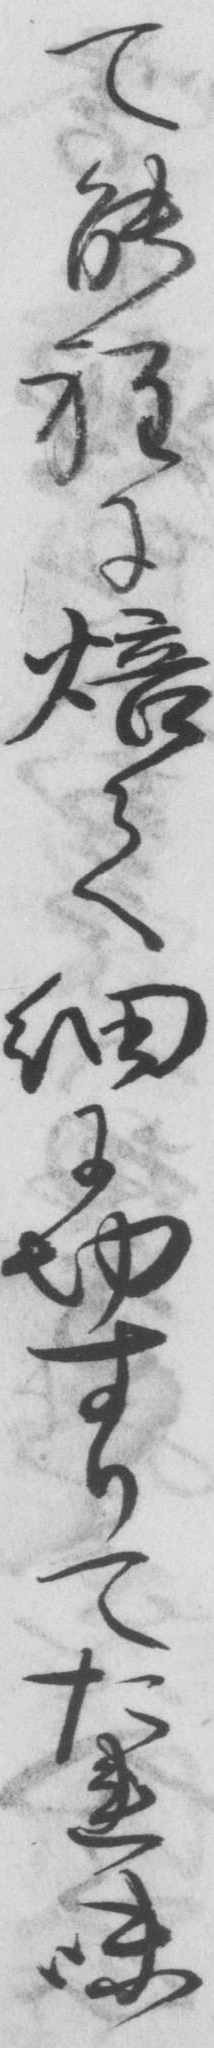て能程に焙て細に切すりてたれ味

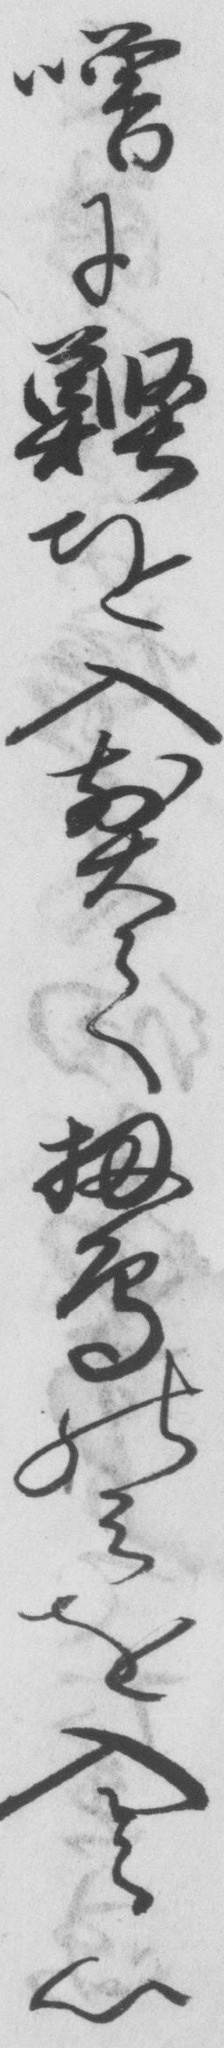噌に鰹を入煮て扨鳥のみいを入て心
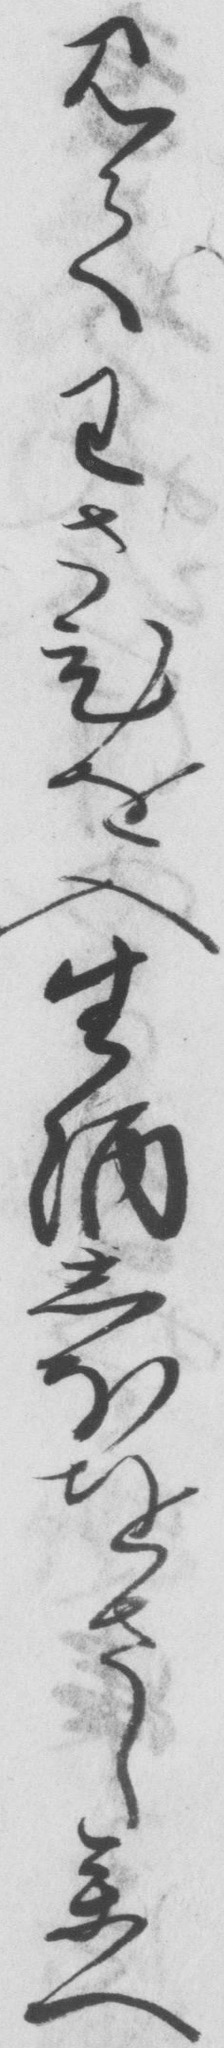みてわさひを入生酒しほをさし参へ
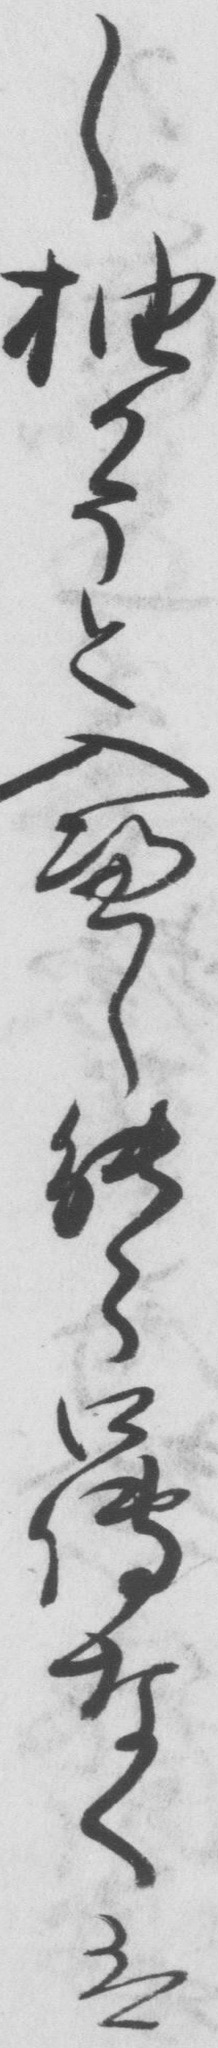し柚かうと入へし能々口伝なくは
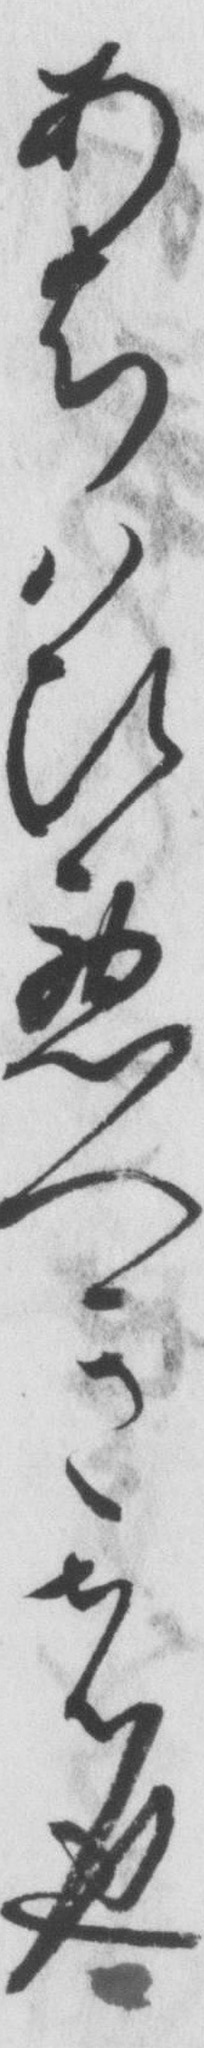あちはひ悪へき者也
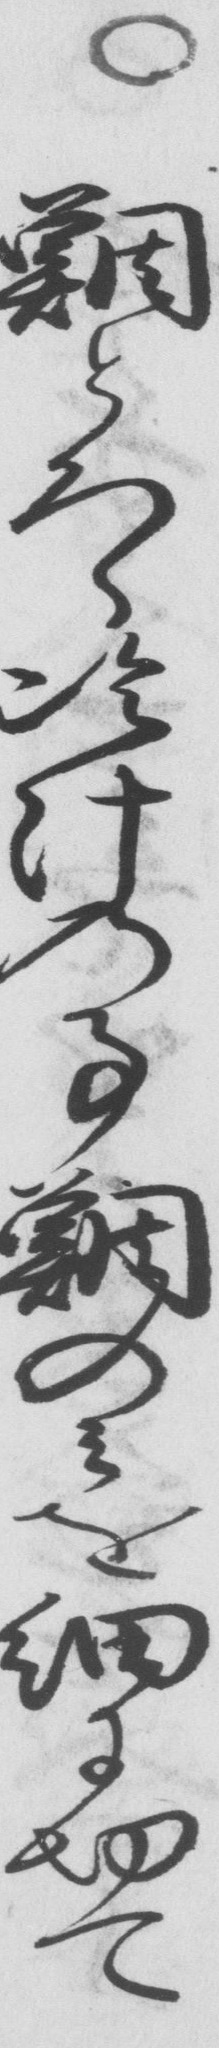一○鯛とろゝ冷汁の事鯛のみを細に切て
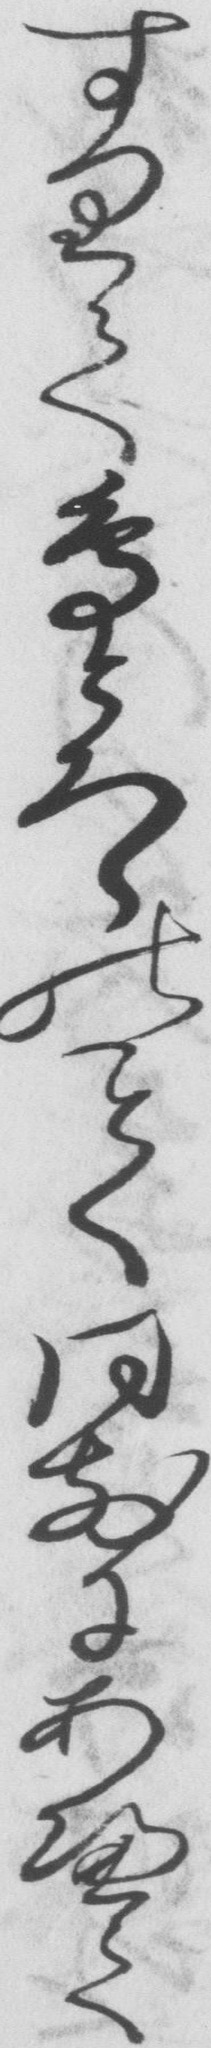すりて鳥とろゝのことく同前にあへて
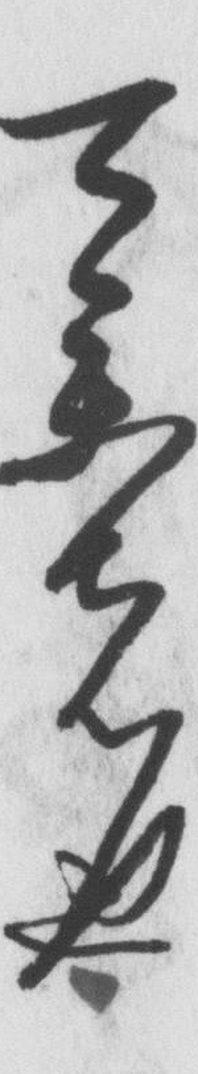可参者也
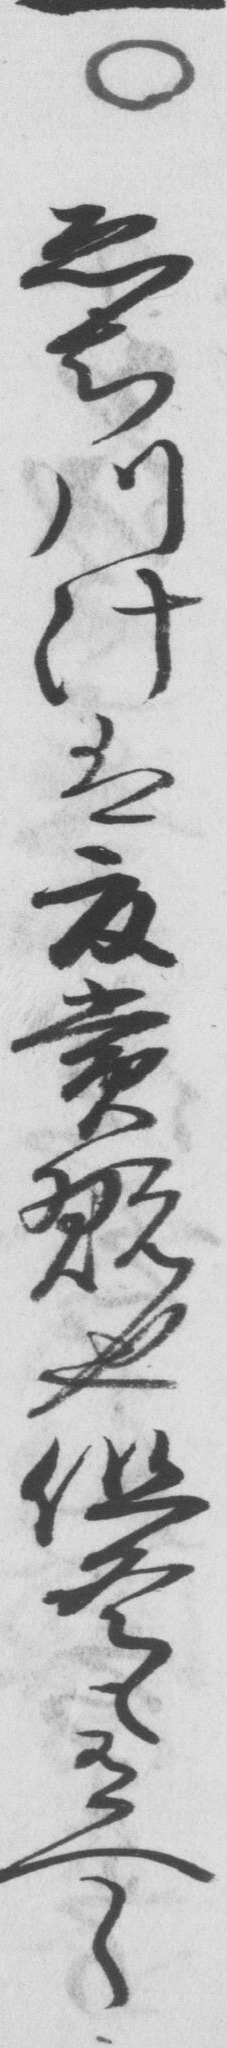一○ゑち川汁は夏賞翫也但冬も有へく
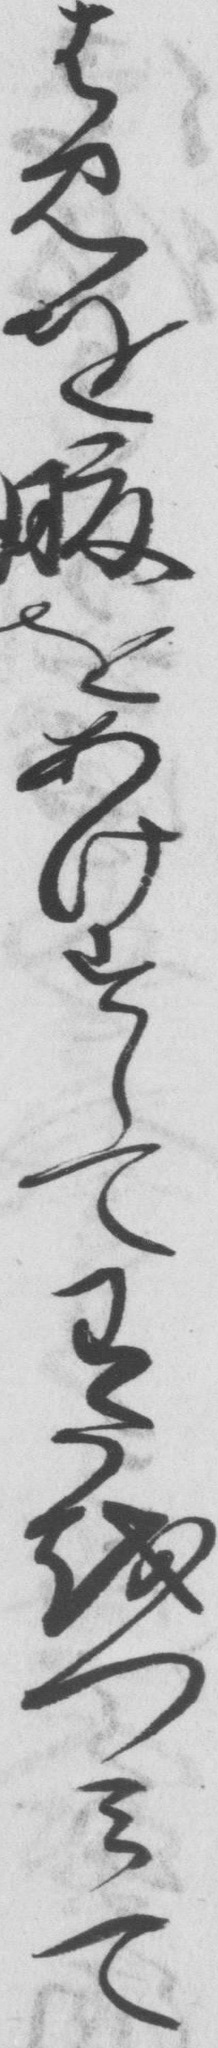はみを腹をあけすしてわたをつみて
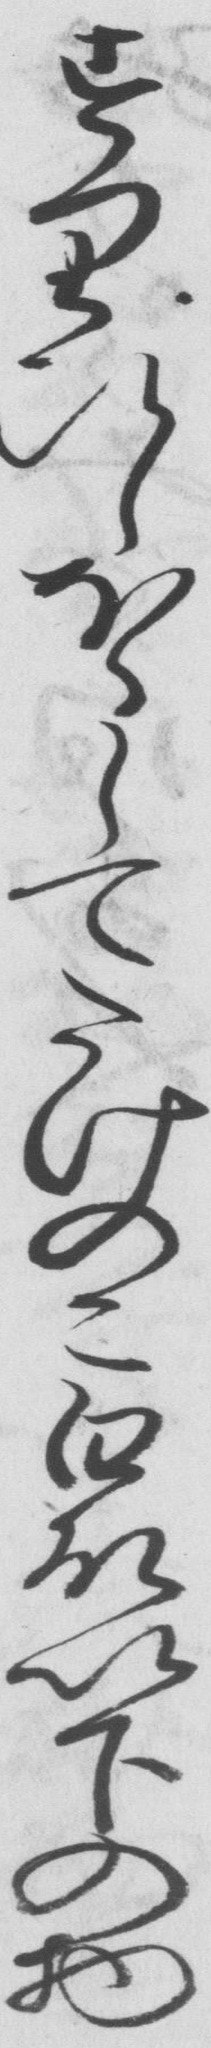すりひしほしてたけのこ白胡以下の物
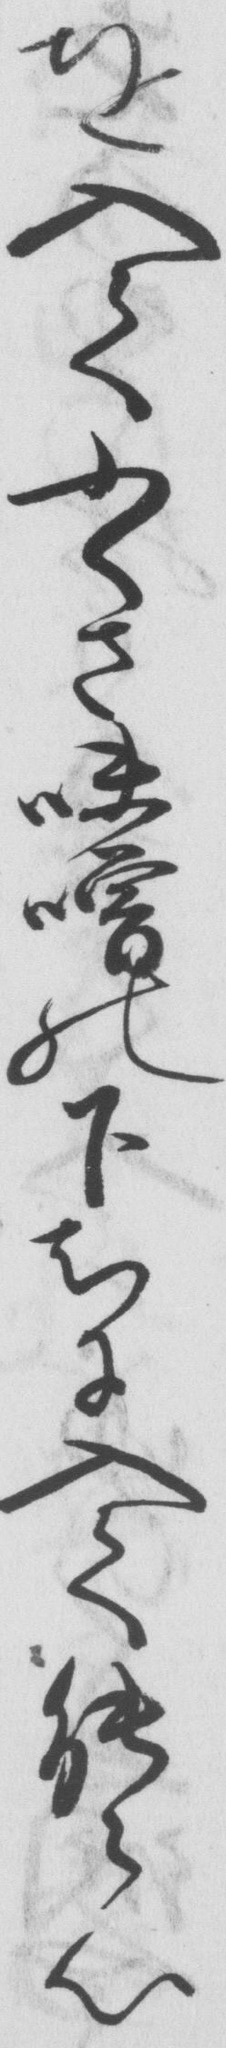を入てふき味噌の下ちに入て能々心
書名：料理次第
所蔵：大阪府立大学学術情報センター 国文学研究資料館
